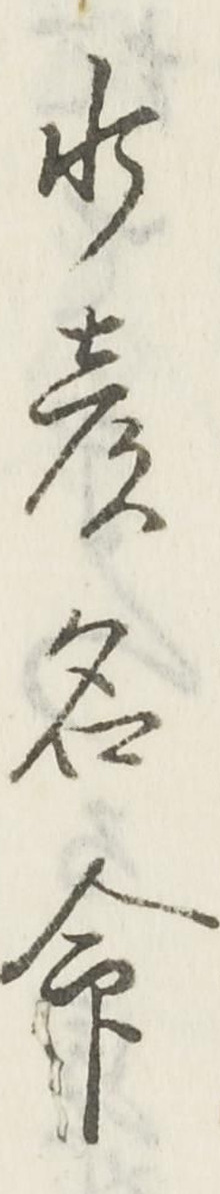少彦名命
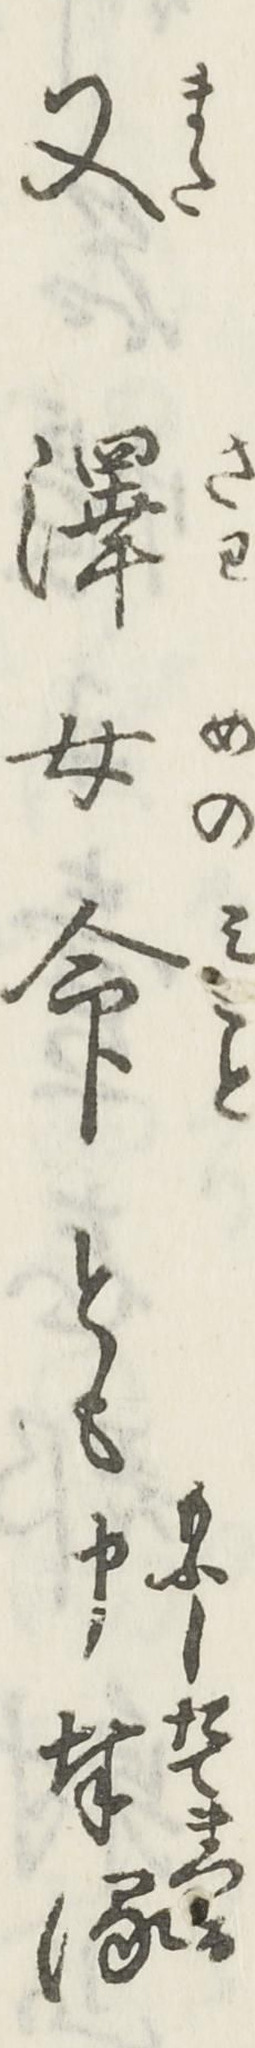又澤女命とも申奉る
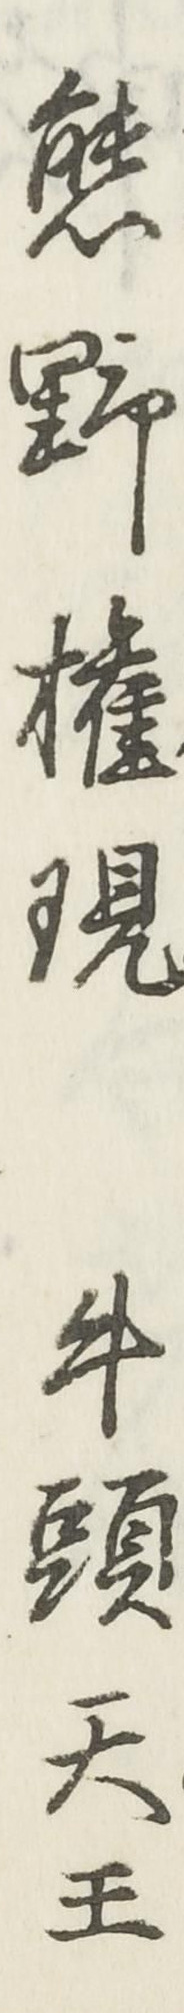熊野権現牛頭天王
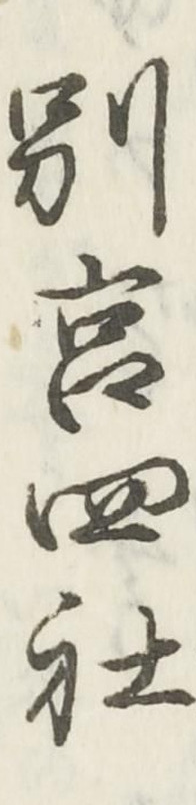別宮四社
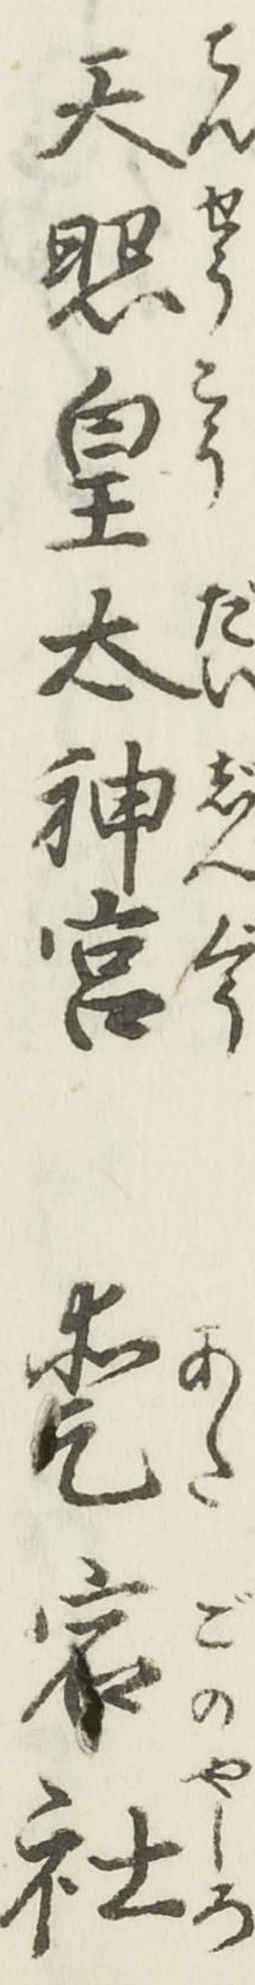天照皇太神宮愛宕社
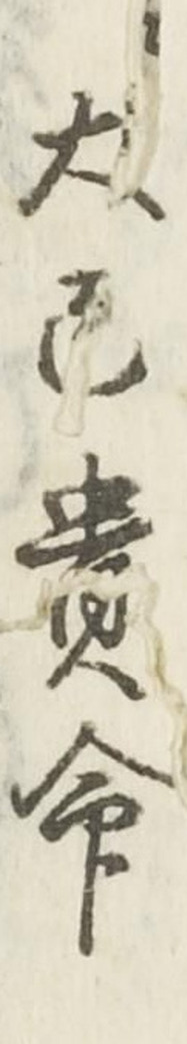大己貴命
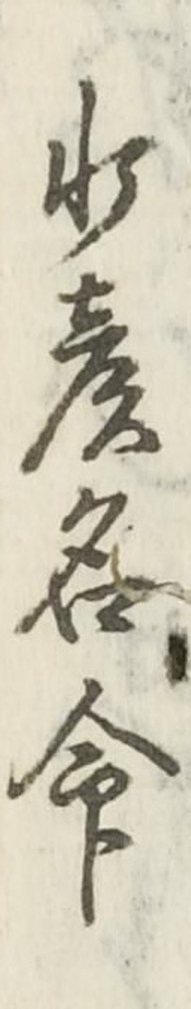少彦名命
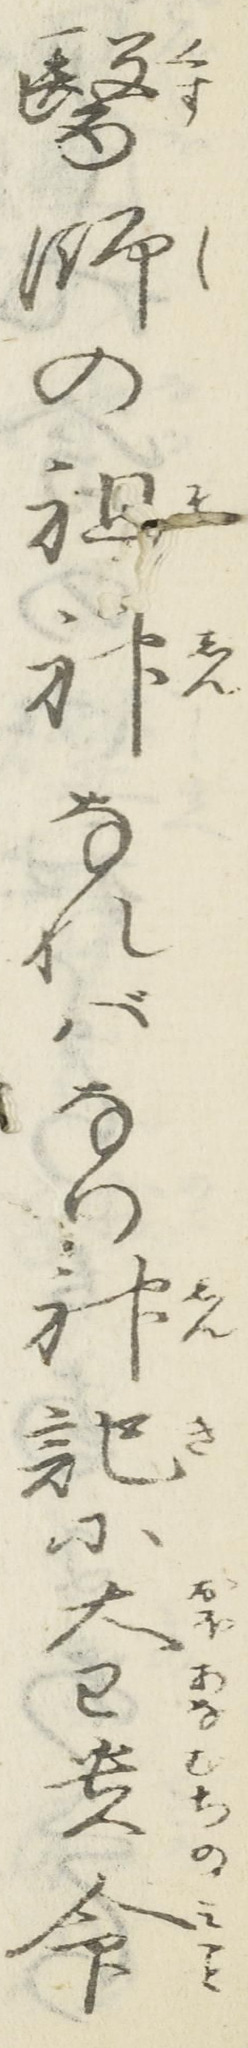醫師の祖神なればなり神記に大己貴命
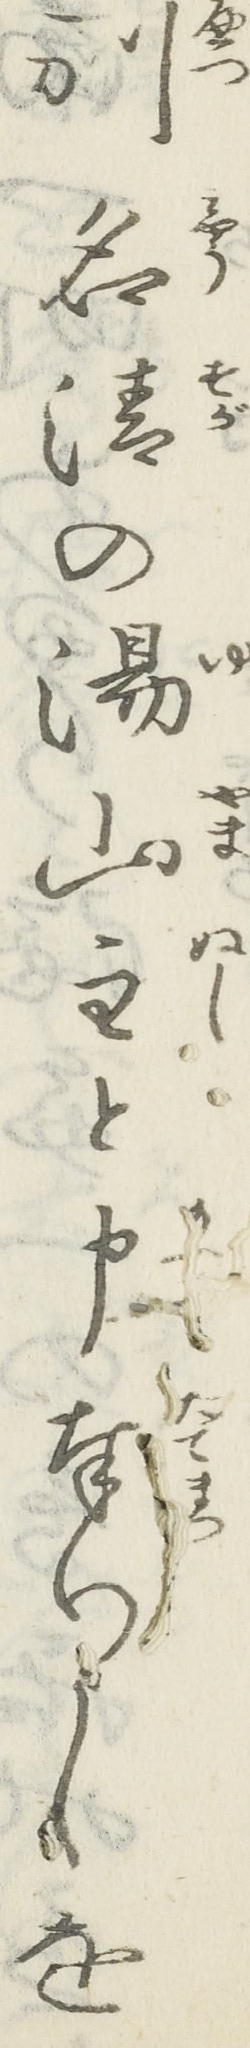別名清の湯山主と申奉りしを
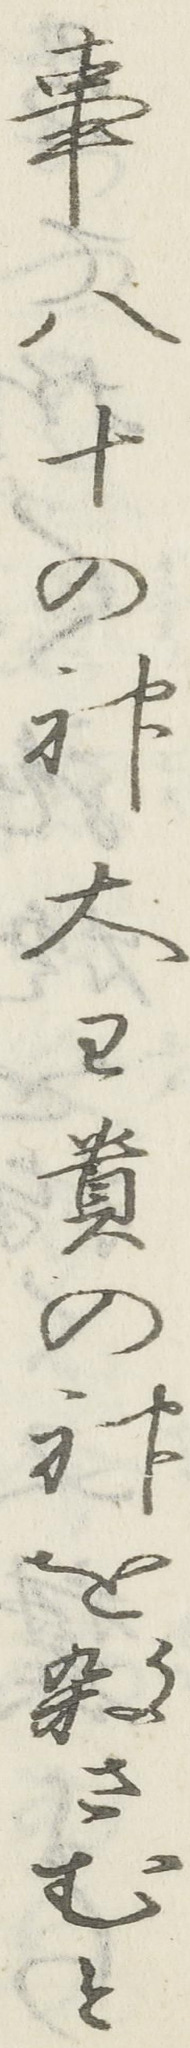事八十の神大己貴を殺さむと
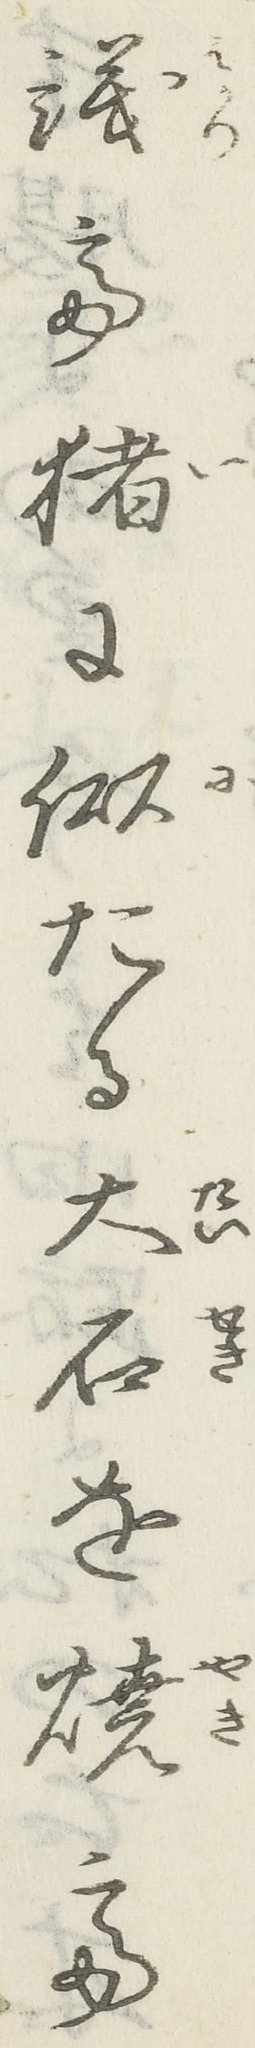議て猪に似たる大石を焼て
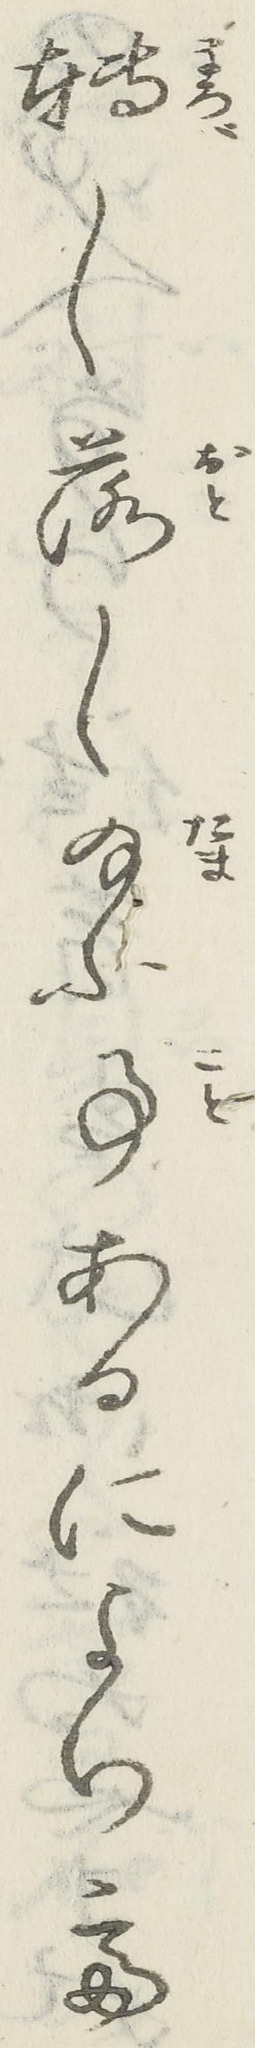轉し落し給ふ事あるによりて
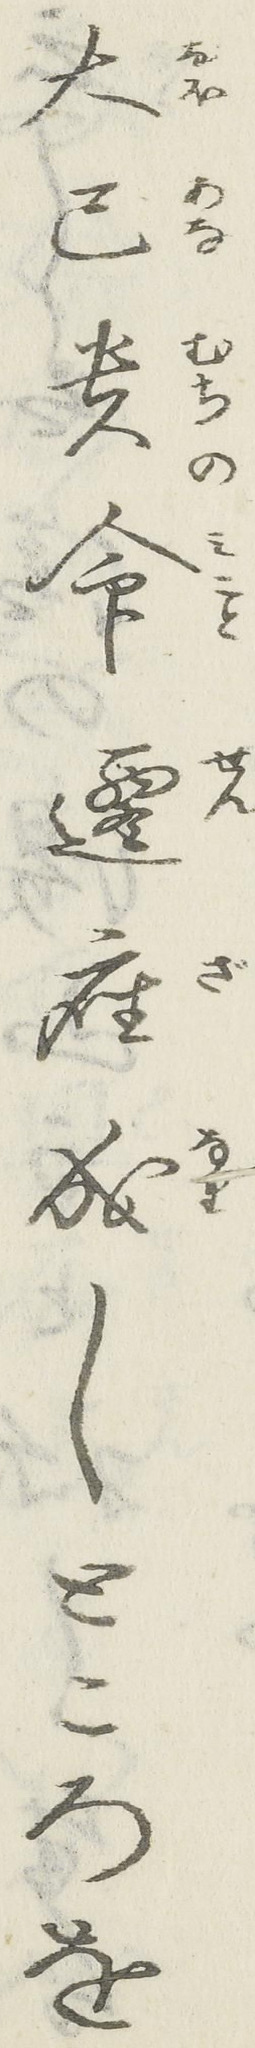大己貴命遷座成しところを
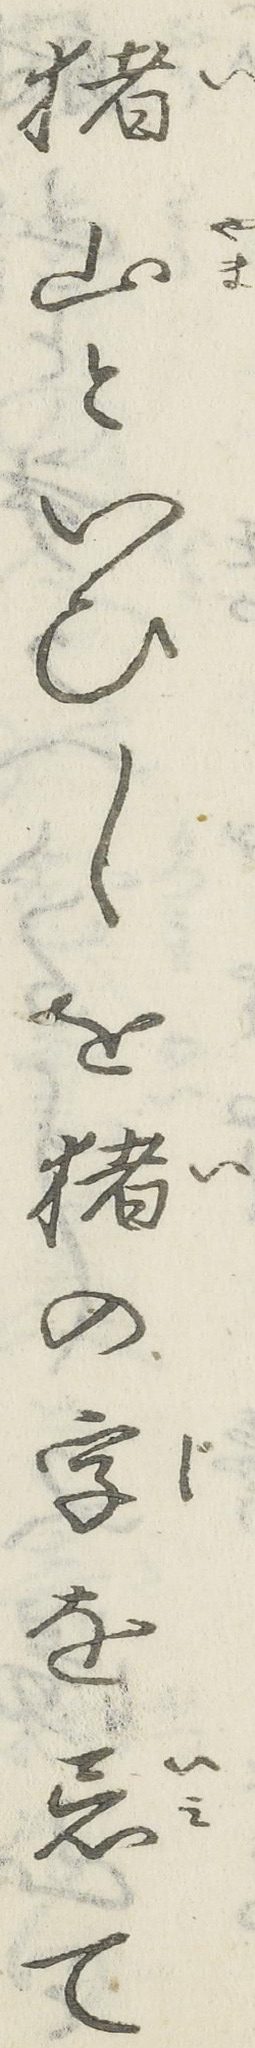猪山といひしを猪の字を忌て

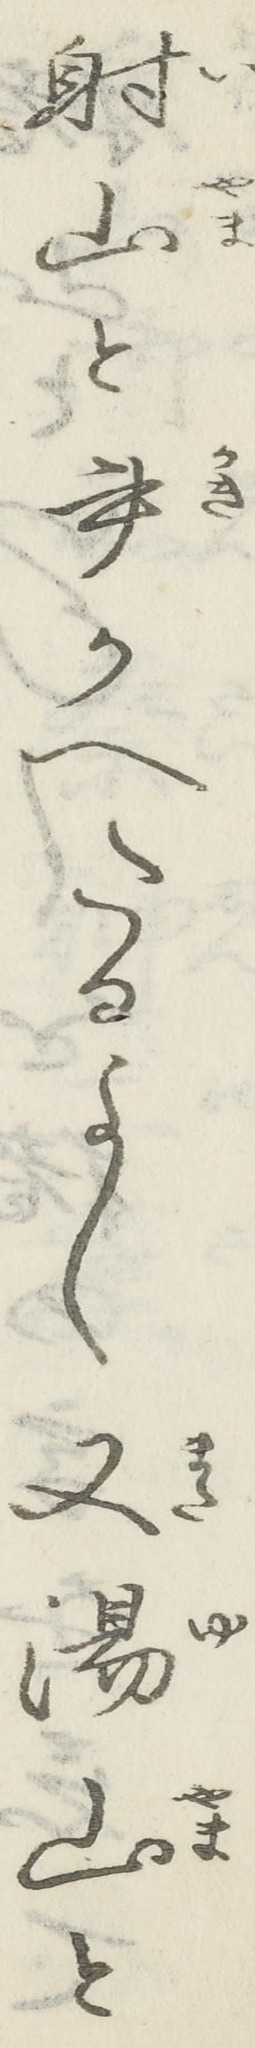射山と書かへたるよし又湯山と
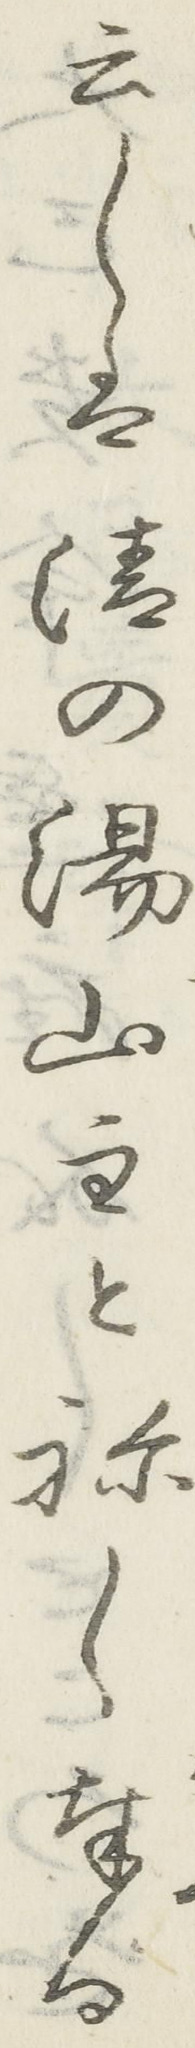云しは清の湯山主と称し奉る
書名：温泉来由記
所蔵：東京大学地震研究所図書室 Earthquake Research Institute Library, The University of Tokyo, JAPAN
